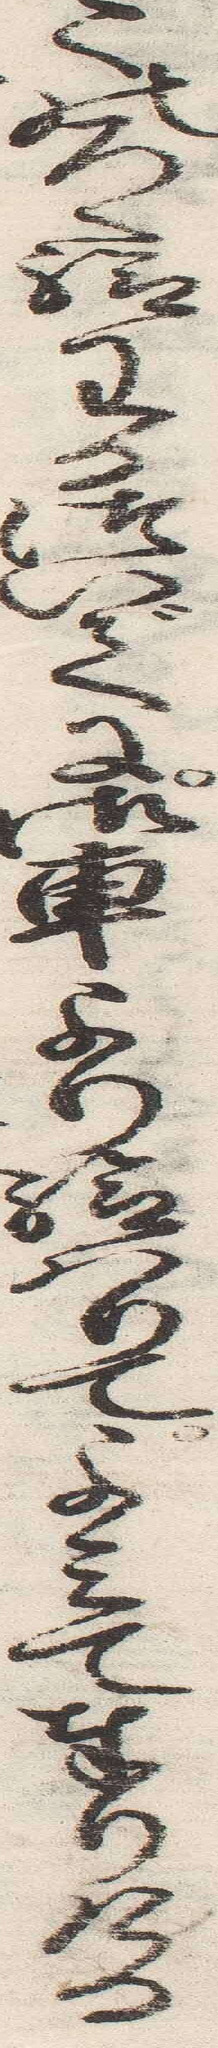々のろく給わるついでに。御車より給はりて。よみて奉りける
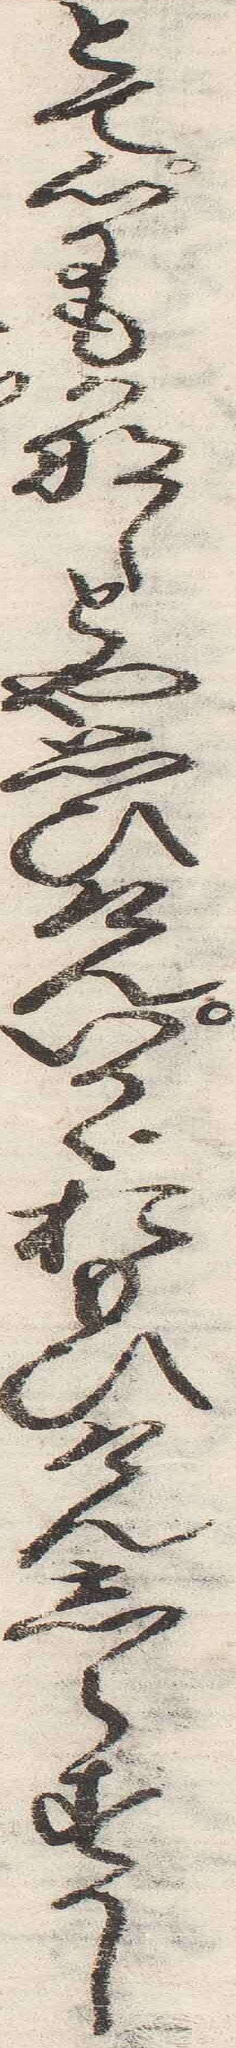とて。心にもかなしとや思ひけん。いかゞおもひけんしらすかし
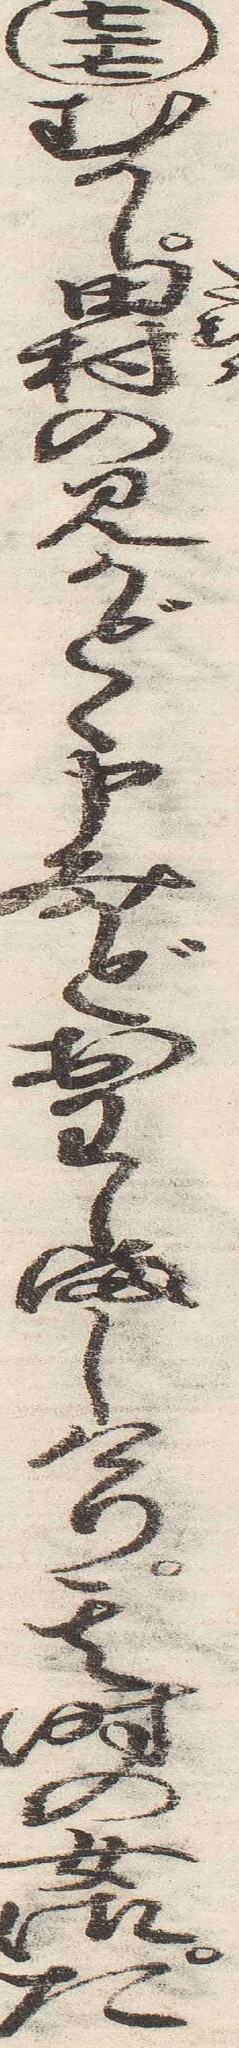七十七むかし。田村のみかどゝ申みかどおわしましけり。其時の女御。た
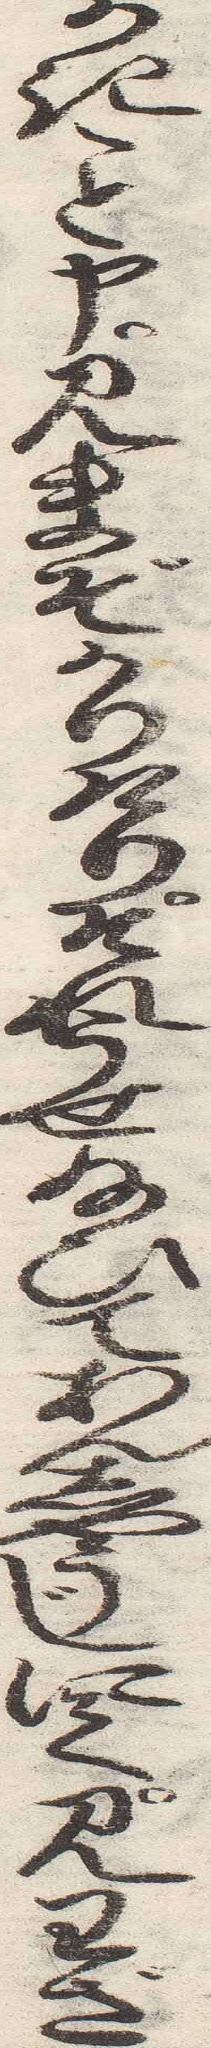かきこと申。みまぞかりけり。それうせ給ひてあんしやうじにて。みわざ
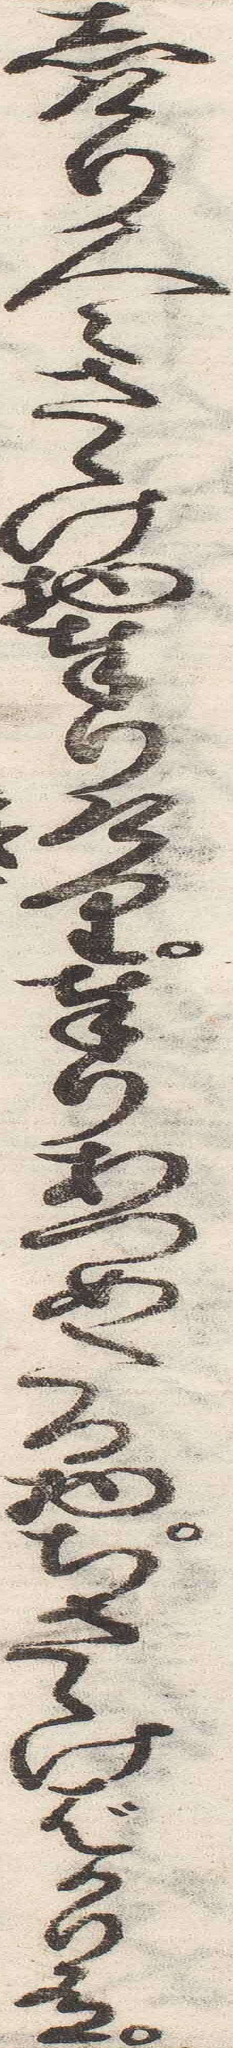しけり人々さゝけ物奉りけり。奉りあつめたる物。ちさゝけばかり有。
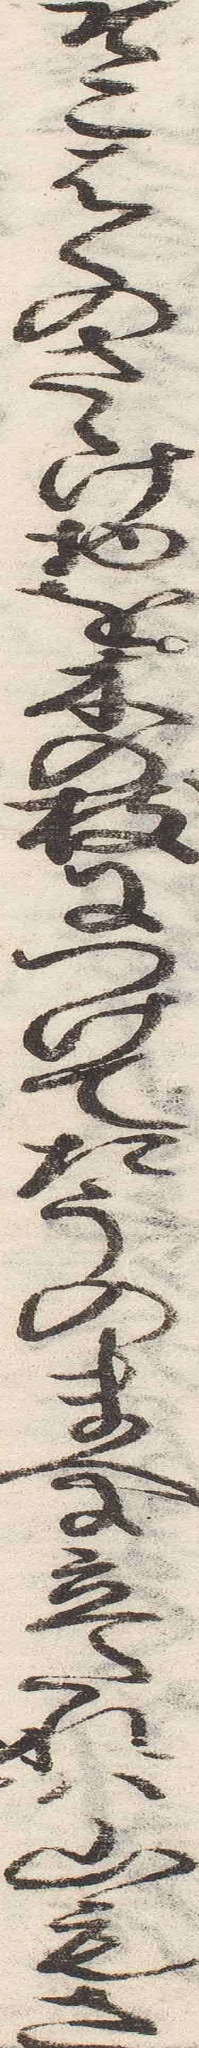そこはくのさゝげ物を。木の枝につけてたうのまへに立たれは山もさ
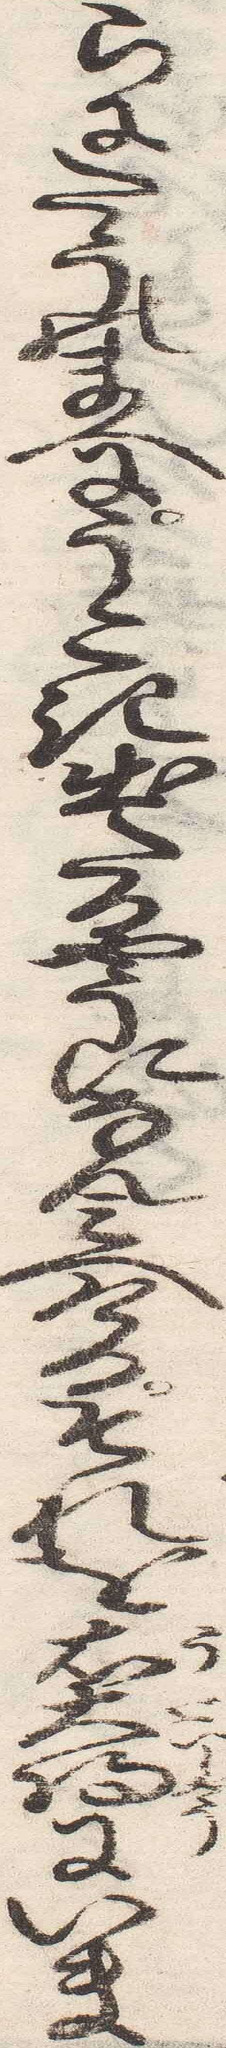らにたうのまへに。うこき出たるやうになんみへける。それを右大将にいま
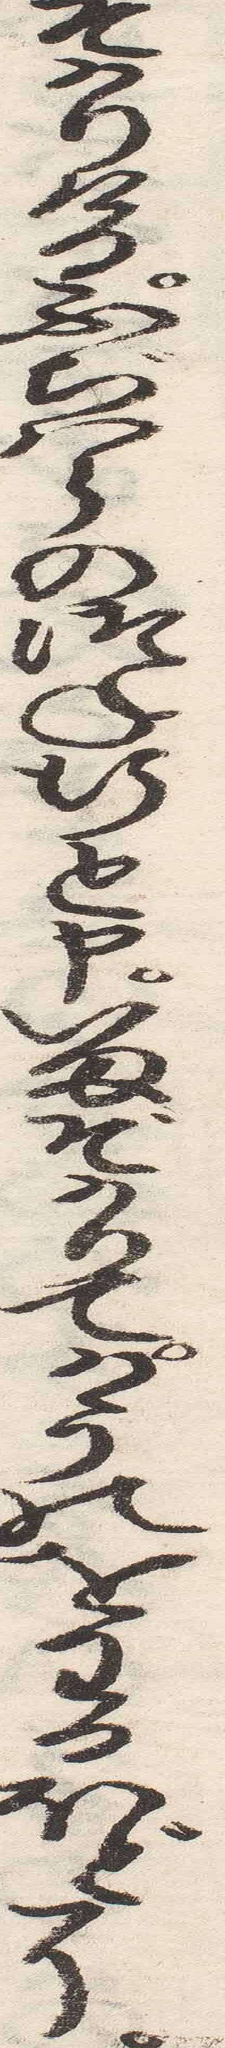そかりける。ふぢはらのつね行と申。いまそかりて。かうのをはるほどに。
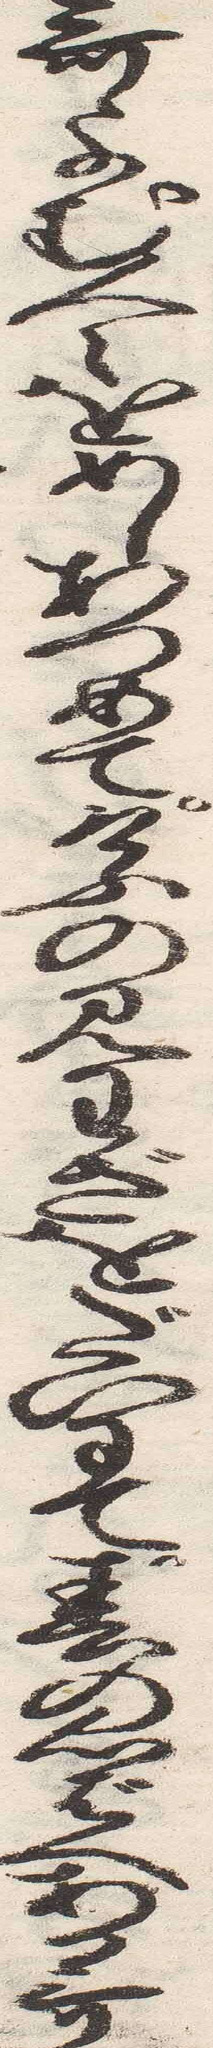哥よむ人々をめしあつめて。けふのみわざをだいにて。春の心ばへある哥
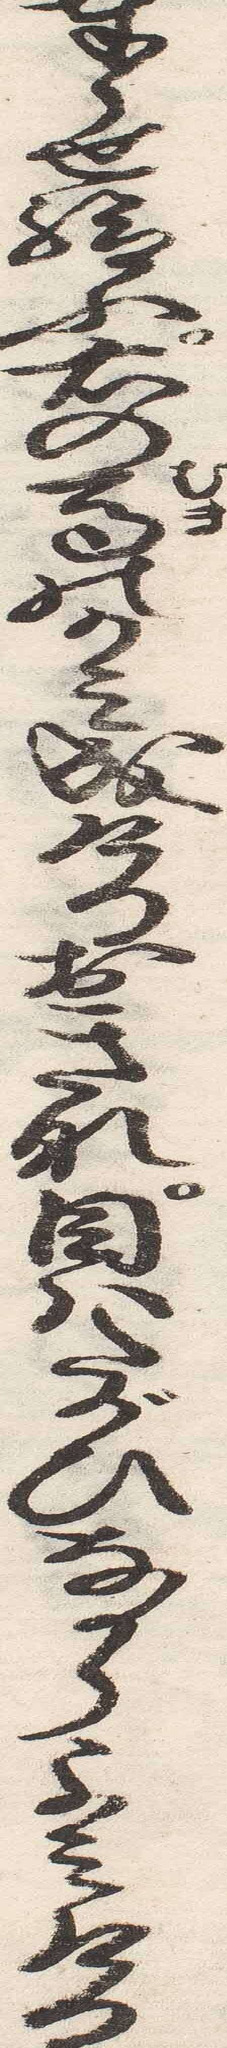奉らせ給ふ。右の馬のかみ成けるおきな。目はたがひなからよみける
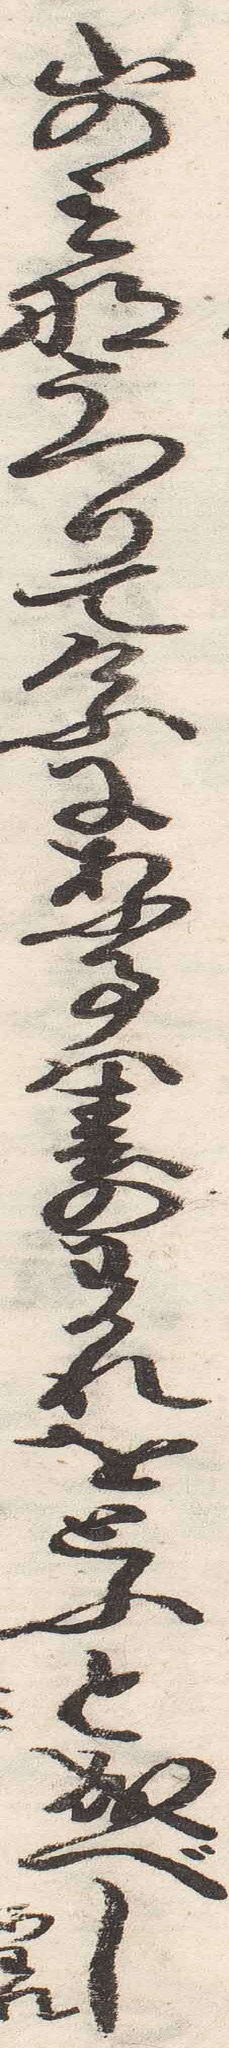山のみなうつりてけふにあふ事は春のわかれをとふと成べし
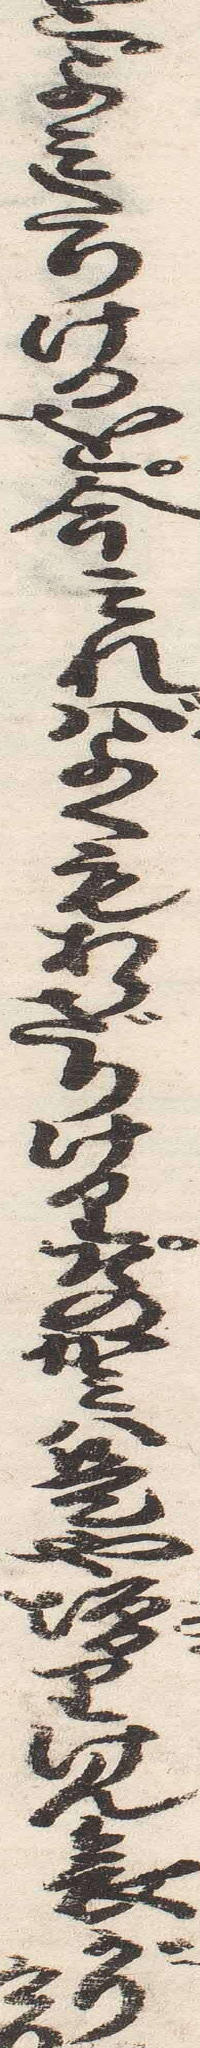と。よみたりけるを。今みればよくもあらざりけり。そのかみは是や増りけん哀がりけり
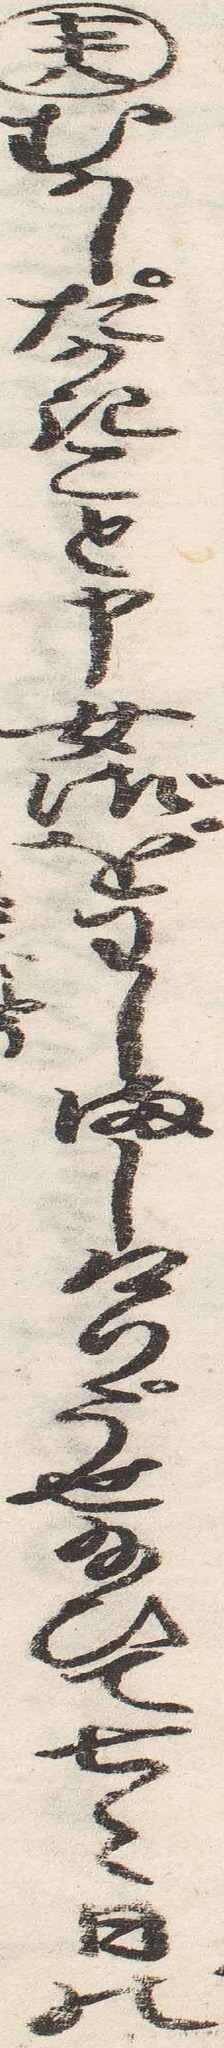七十八むかし。たかきこと申女”御。をわしましけり。うせ給ひて七々日の
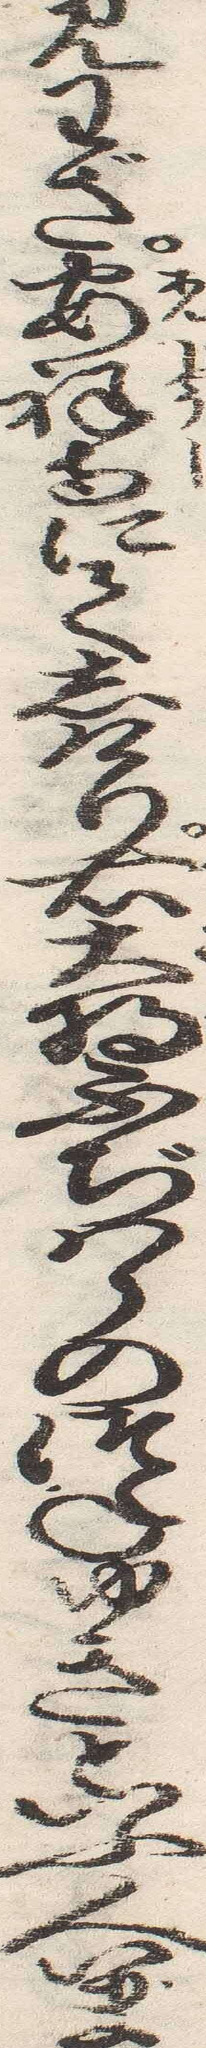みわざ。安祥寺にてしけり。右大将ふぢはらのつねゆきといふ人いま
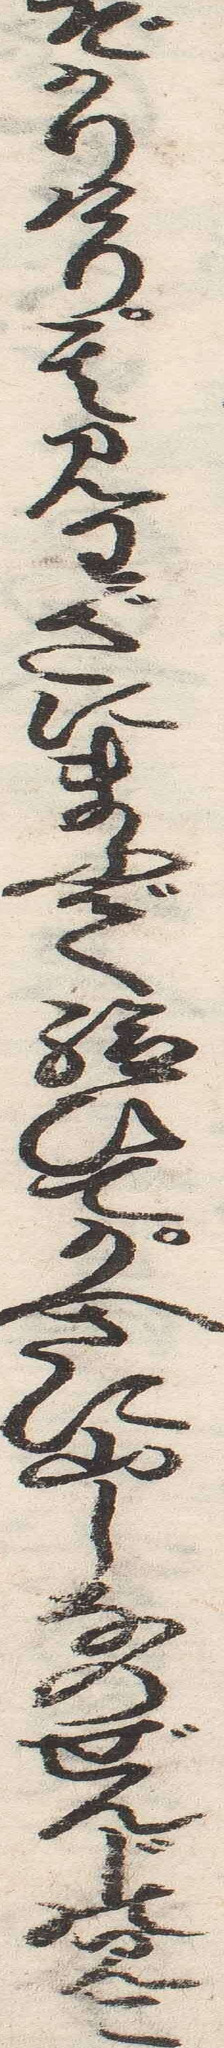そがりけり。其みわざにまふで給ひて。かへさに山しなのぜんじのみこ
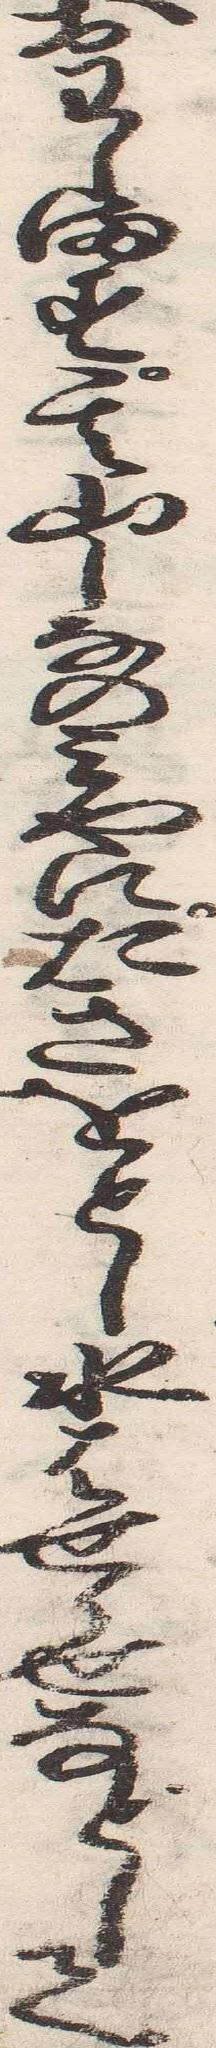おわします。其山しなのみやに。たきをとし水はせらせなどして。
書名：伊勢物語
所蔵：東京学芸大学附属図書館 国文学研究資料館
